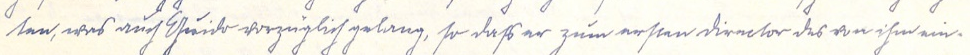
ten, was auch Guido vorzüglich gelang, so dass er zum ersten Director des von ihm ein-
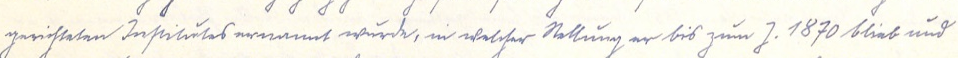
gerichteten Institutes ernannt wurde, in welcher Stellung er bis zum J. 1870 blieb und
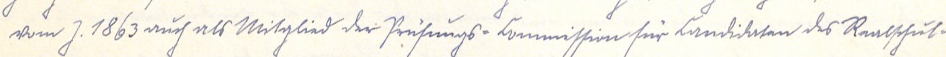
vom J. 1863 auch als Mitglied der Prüfungs-Commission für Candidaten des Realschul-
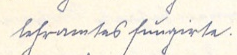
lehramtes fungierte.
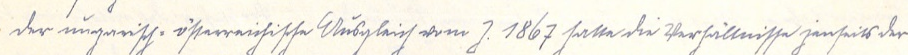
Der ungarisch-österreichische Ausgleich vom J. 1867 hatte die Verhältnisse jenseits der
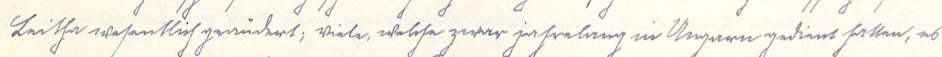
Leitha wesentlich geändert; viele, welche zwar jahrelang in Ungarn gedient hatten, es
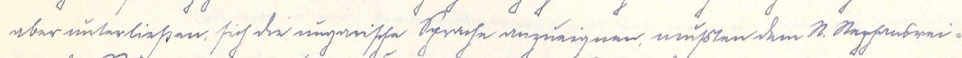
aber unterließen sich der ungarischn Sprache anzuzeigen, musste dem St. Stephansrei-
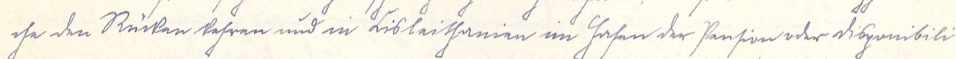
che den Rücken kehren und in Cisleithanien im Hafen der Pansion oder Disponibili-
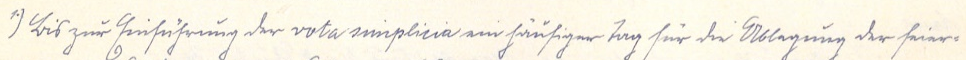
1.) Bis zur Einführung der vota simplicia ein häufiger Tag für die Ablegung der feier-
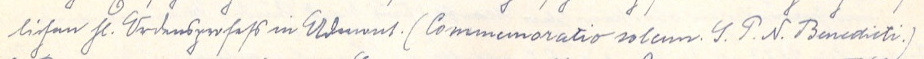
lichen hl. Ordensprofess in Admont. (Commemoratio volum. S. P. N. Benedicti.)
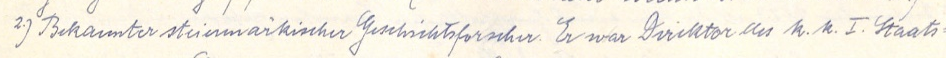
2.) Bekannter steiermärkischer Geschichtsforscher. Er war Direktor des k. k. I. Staats-
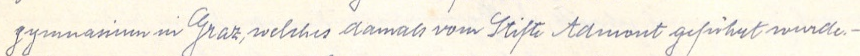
gymnasium in Graz, welches damals vom Stifte Admont geführt wurde. -
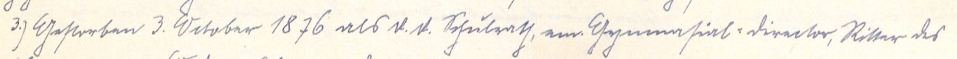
3.) Gestorben 3. October 1876 als k. k. Schulrath, ein Gymnasial-Director, Ritter des
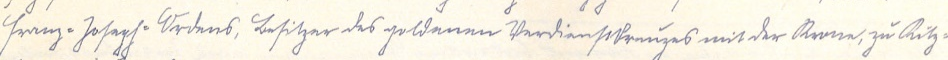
Franz-Joseph-Ordens, Besitzer des goldenen Verdienstkreuzes mit der Kron, zu Kitz-
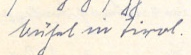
bühel in Tirol.
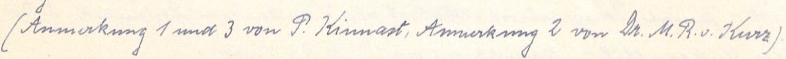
(Anmerkung 1 und 3 von P. Kienast, Anmerkung 2 von Dr. M. R. v. Karz)
